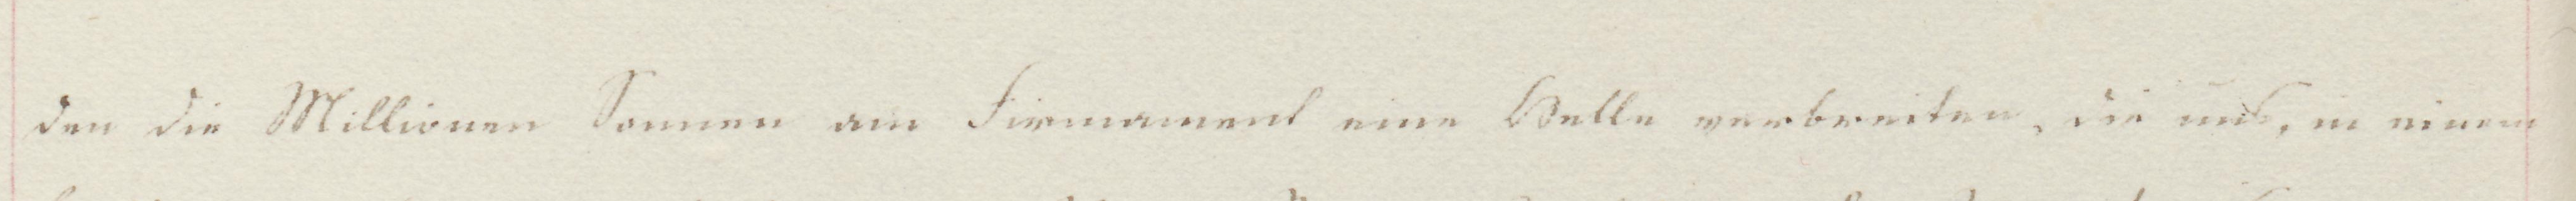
den die Millionen Sonnen am Firmament eine Helle verbreiten, die uns, in einem
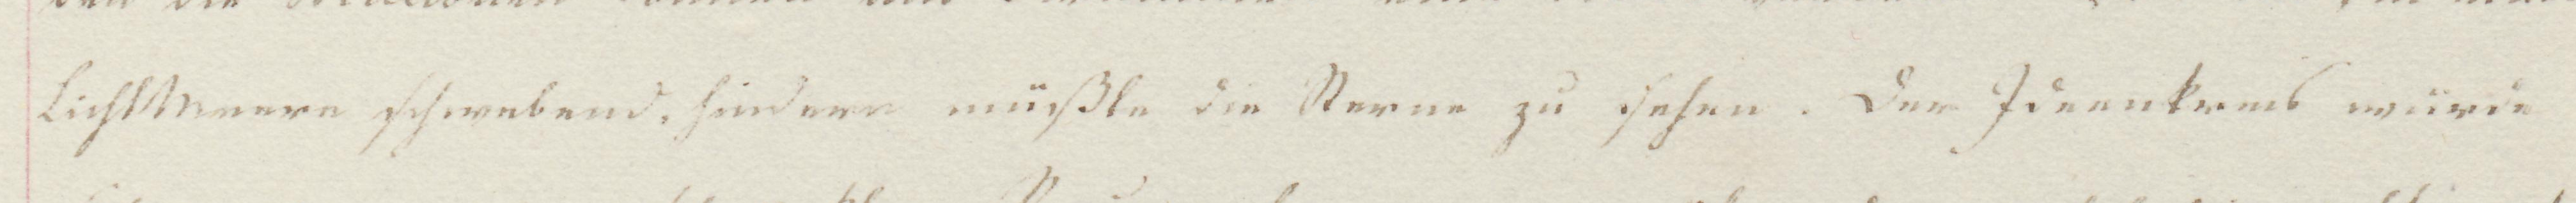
LichtMeere schwebend, hindern müßte die Sterne zu sehen. Der Ideenkreis würde
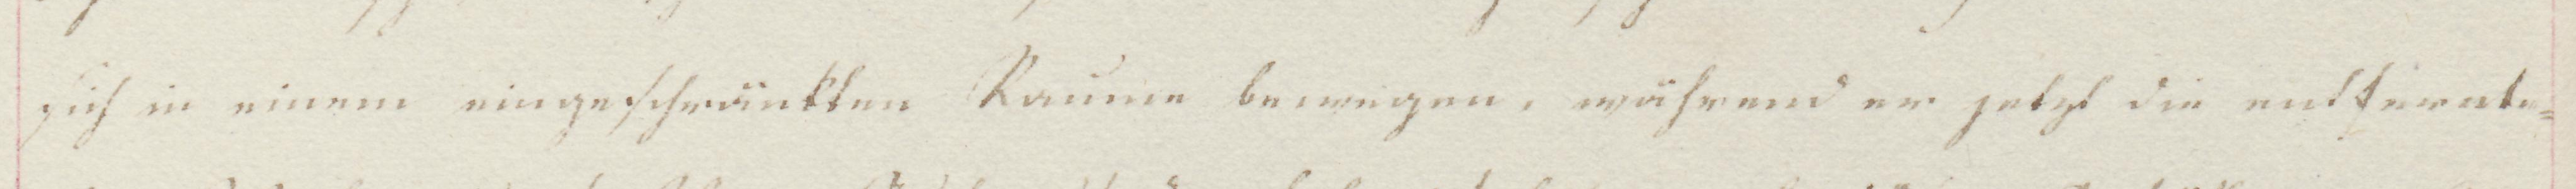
sich in einem eingeschränkten Raume bewegen, während er jetzt die entfernte-
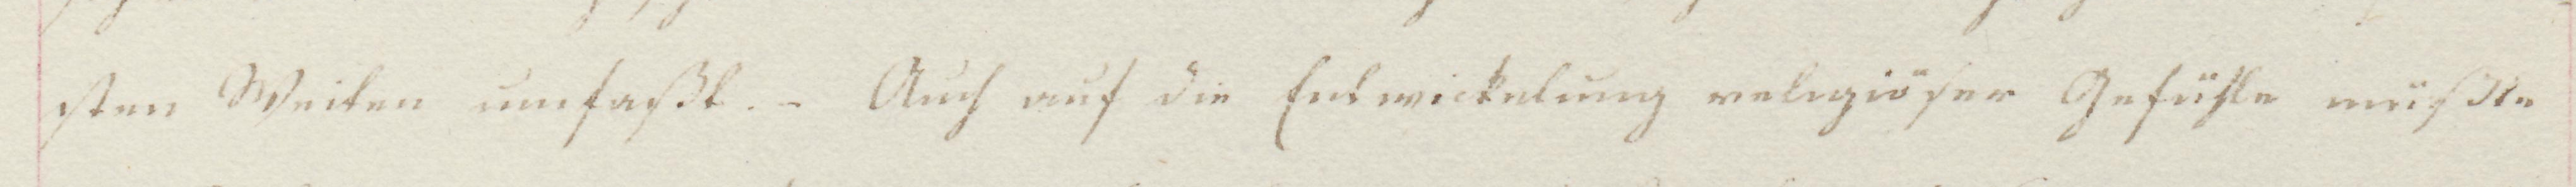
sten Weiten umfaßt. – Auch auf die Entwickelung religiöser Gefühle müßte
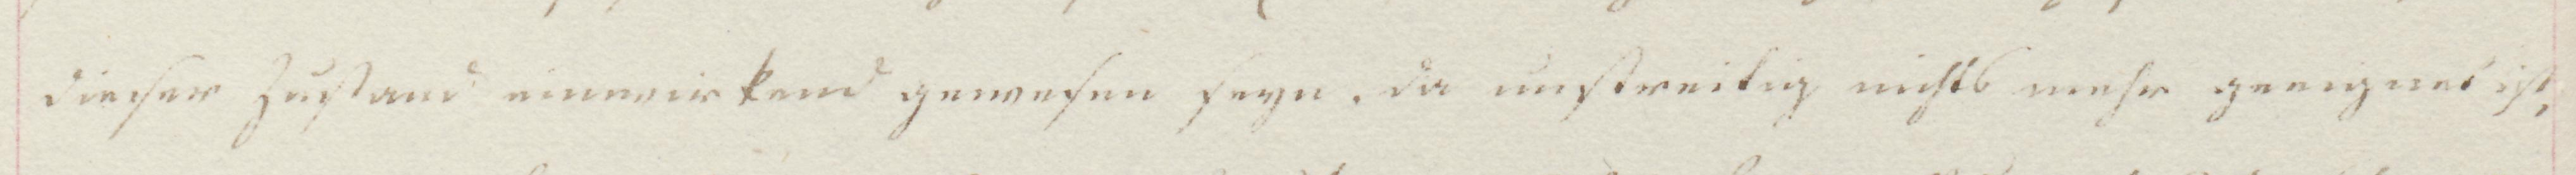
dieser Zustand einwirkend gewesen sein, da unstreitig nichts mehr geeignet ist,
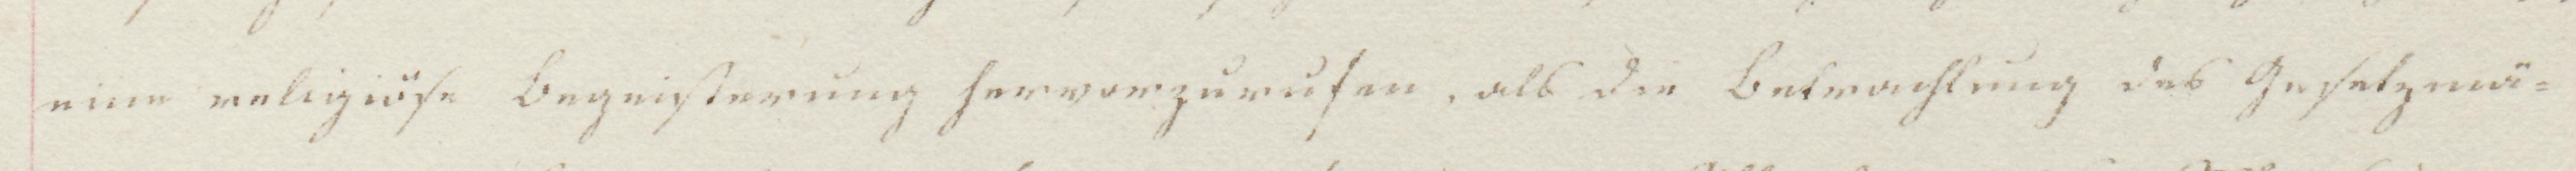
eine religiöse Begeisterung hervorzurufen, als die Betrachtung des Gesetzmä-
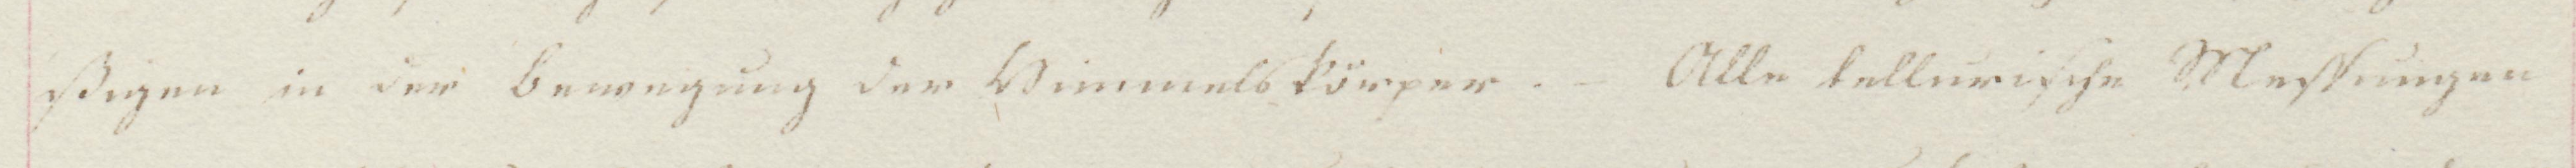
ßigen in der Bewegung der Himmelskörper. – Alle tellurische Messungen
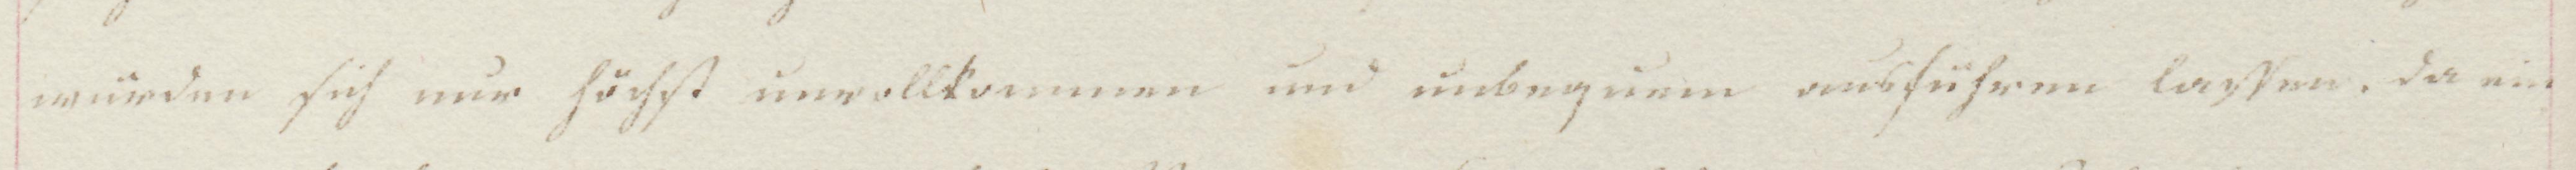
würden sich nur höchst unvollkommen und unbequem ausführen lassen, da ein
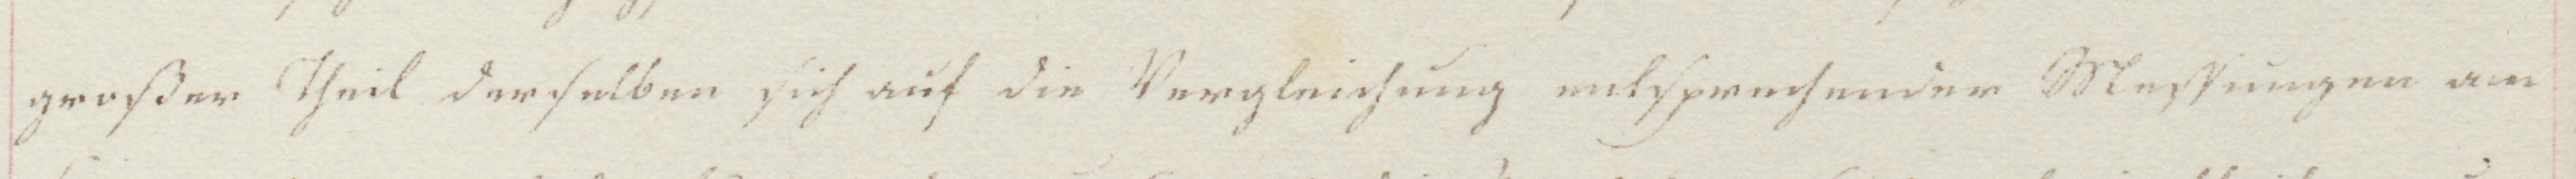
großer Theil derselben sich auf die Vergleichung entsprechender Messungen am
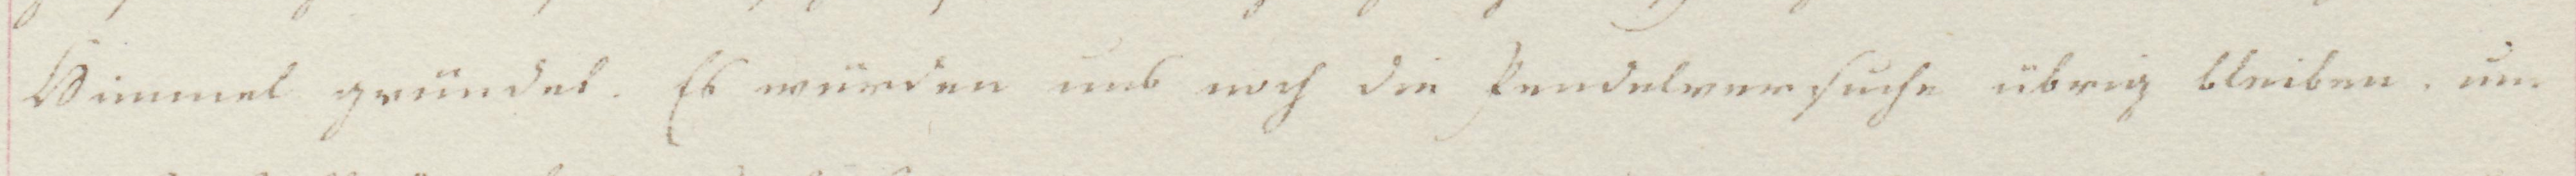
Himmel gründet. Es würden uns noch die Pendelversuche übrig bleiben, um
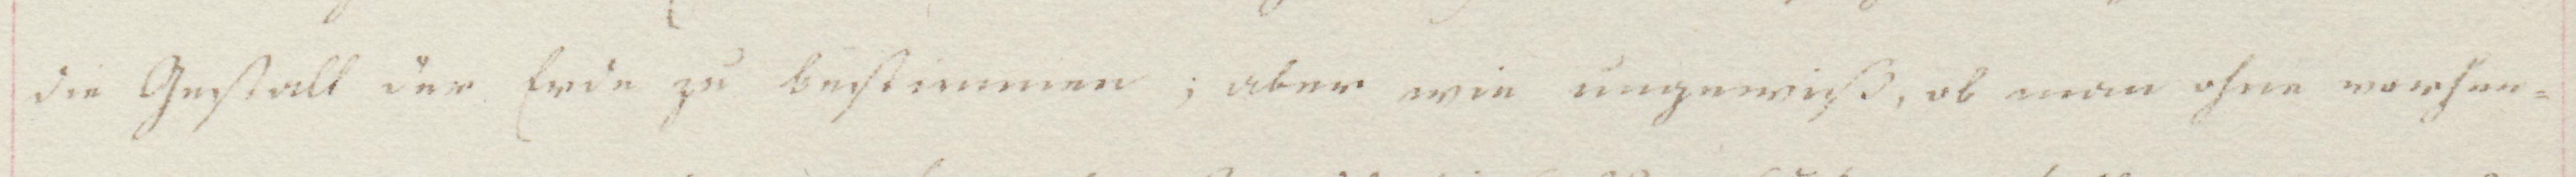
die Gestalt der Erde zu bestimmen; aber wie ungewiß, ob man ohne vorher-
